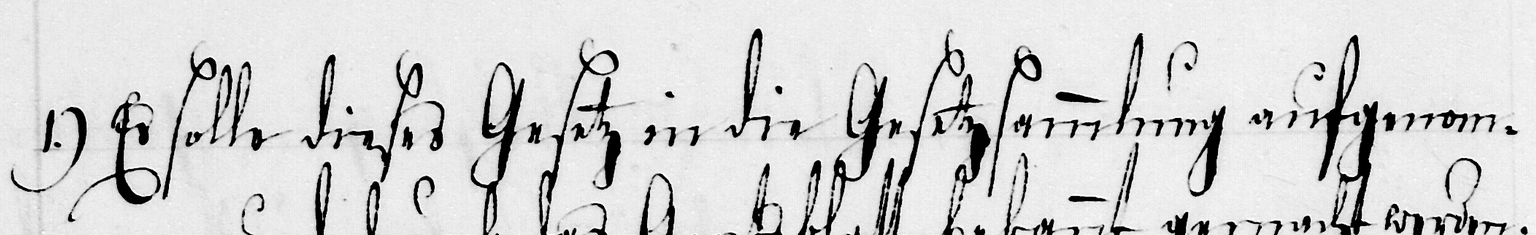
solle dieses Gesetz in die Gesetzsammlung aufgenom¬
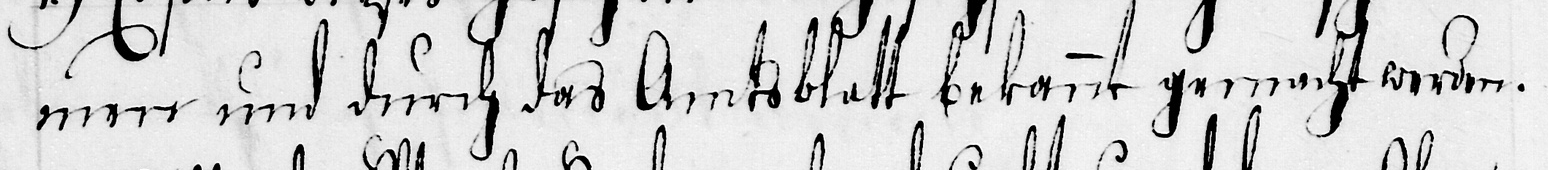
men und durch das Amtsblatt bekannt gemacht werden.
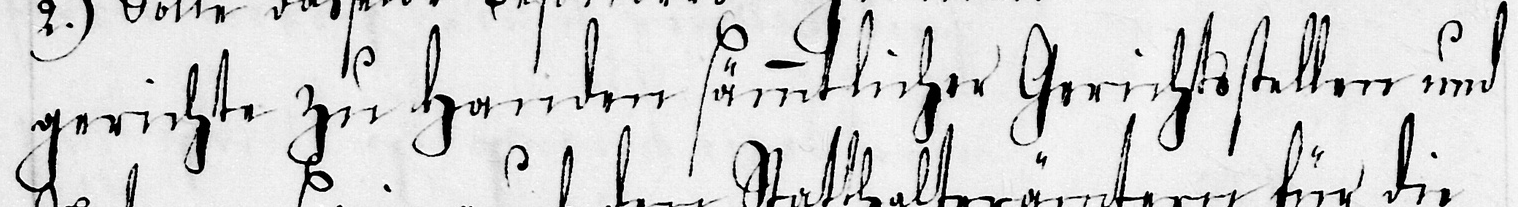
gerichte zu Handen sämmtlicher Gerichtsstellen und
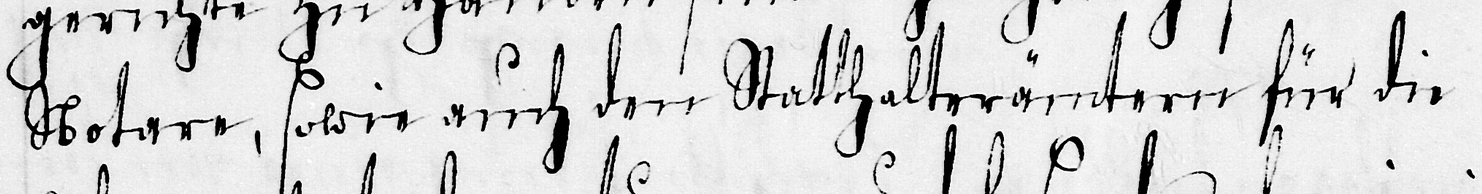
Notare, sowie auch den Statthalterämtern für die
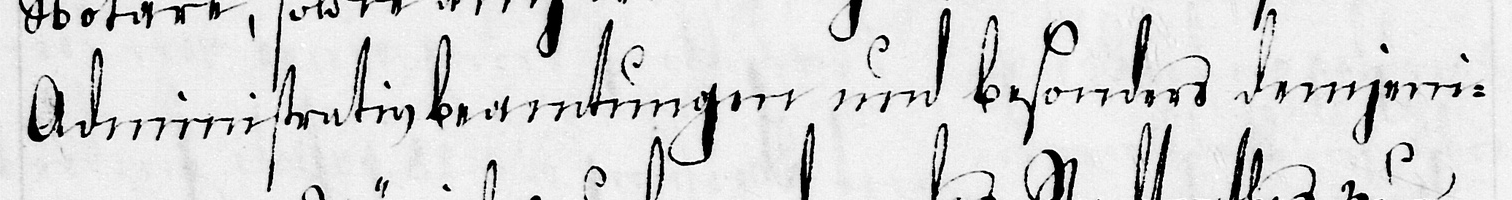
Administrativbeamtungen und besonders denjeni¬
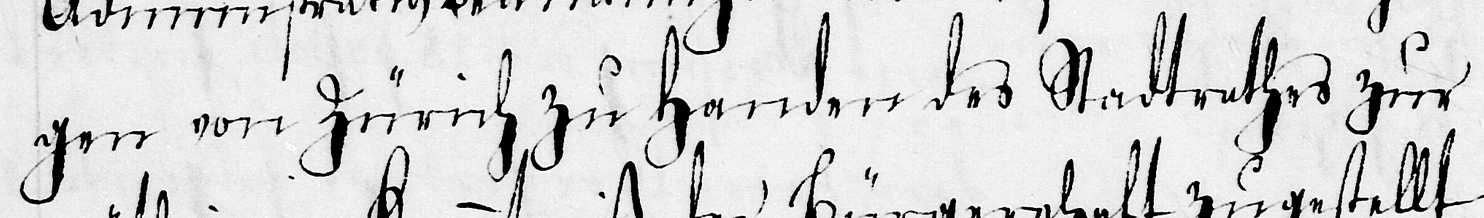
gen von Zürich zu Handen des Stadtrathes zur
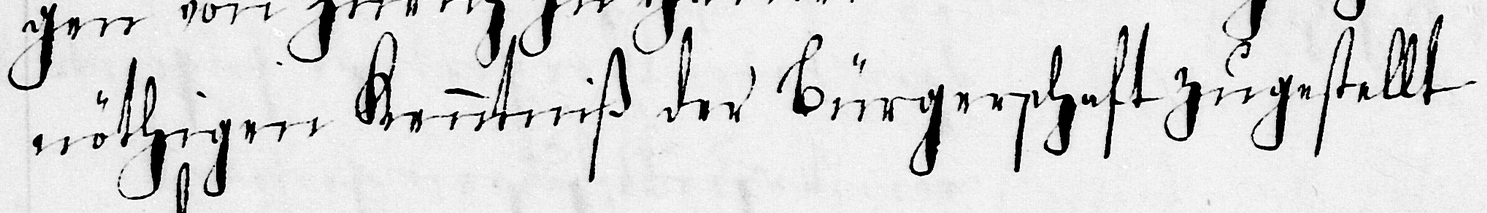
nöthigen Kenntniß der Bürgerschaft zugestellt
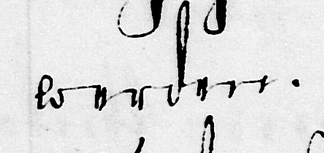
werden.
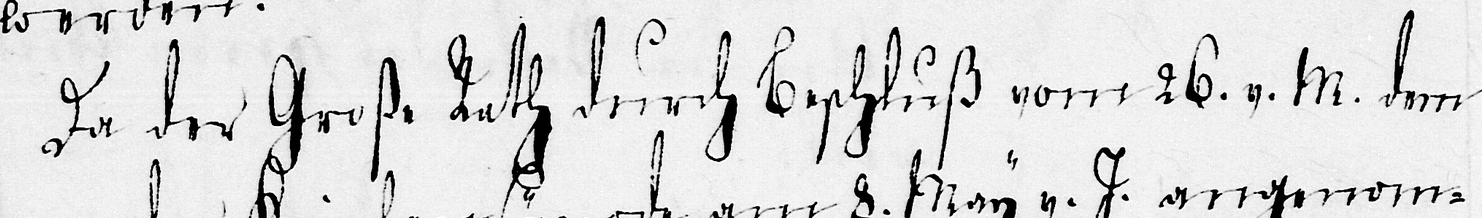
Da der Große Rath durch Beschluß vom 26. v. M. dem
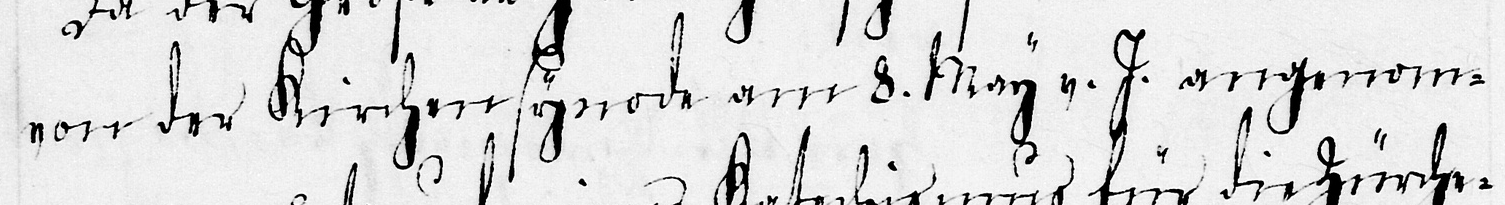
von der Kirchensynode am 8. May v. J. angenom¬
